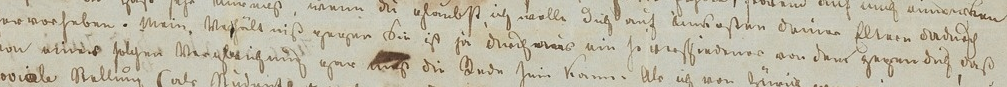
hervorheben. Mein Verhältniß gegen sie ist ja durchaus ein so verschiedenes von dem gegen dich, daß
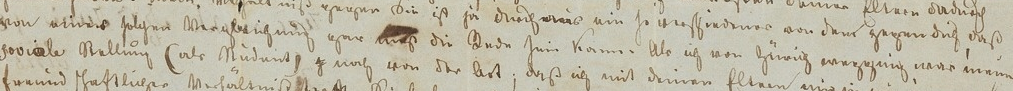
von einer solchen Vergleichung gar nicht die Rede sein kann. Als ich von Zürich wegging, war meine
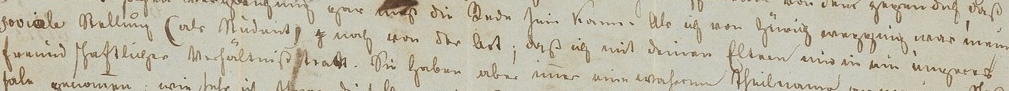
sociale Stellung (als Student) z noch von der Art; daß ich mit deinen Eltern nie in ein engeres
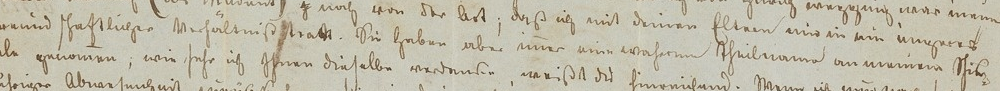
freundschaftliches Verhältniß tratt. Sie haben aber immer eine wahrme Theilname an meinem Schik-
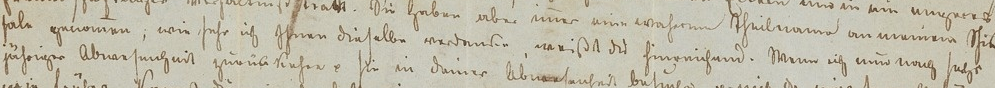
sale genommen; wie sehr ich Ihnen dieselbe verdanke, weißt du hinreichend. Wenn ich nun nach sechs
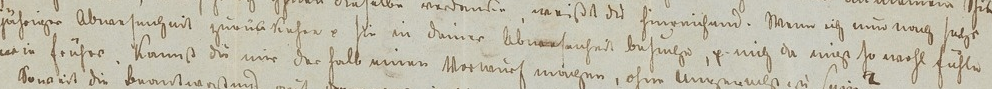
jähriger Abwesenheit zurükkehre & sie in deiner Abwesenheit besuche, & mich da nicht so wohl fühle
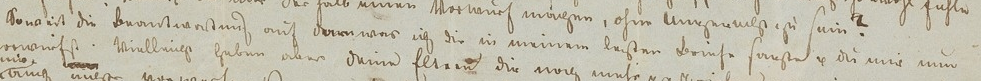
Soweit die Beantwortung auf dein das was ich dir in meinem lezten Briefe sagte & du mir nun
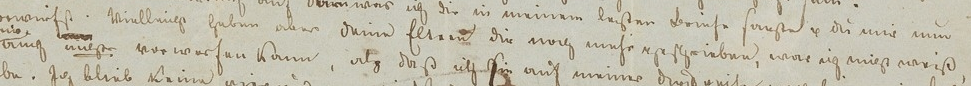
vorwirfst. Vielleicht haben aber deine Eltern dir noch mehr geschrieben, was ich nicht weiß,
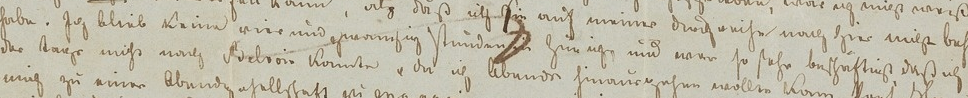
habe. Ich blieb keine vier und zwanzig Stunden in Zürich und war so sehr beschäftigt, daß ich
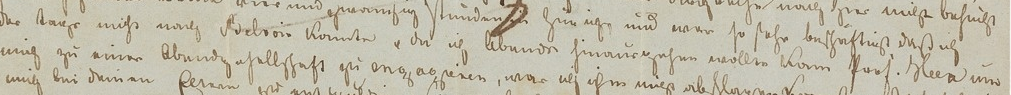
des Tags nicht nach Belvoir konnte & da ich Abends hinausgehen wollte kam Prof. Heer um
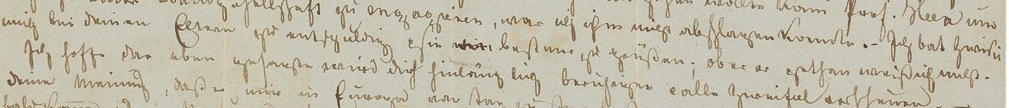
mich bei deinen Eltern zu entschuldigen & sie bestens zu grüßen; ob er es gethan weiß ich nicht.
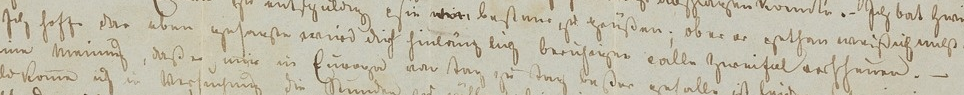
Ich hoffe das eben gesagte wird dich hinlänglich beruhigen & alle Zweifel verscheuen. –
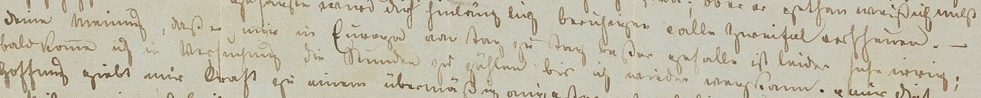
Deine Meinung, daß es mir in Europa von Tag zu Tag beßer gefalle ist leider sehr irrig;
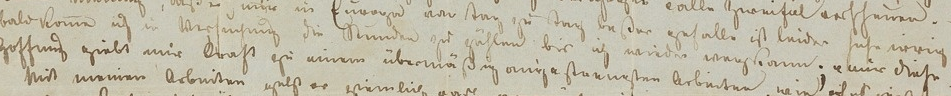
bald komme ich in Versuchung die Stunden zu zählen, bis ich wieder weg kann; & nur diese
